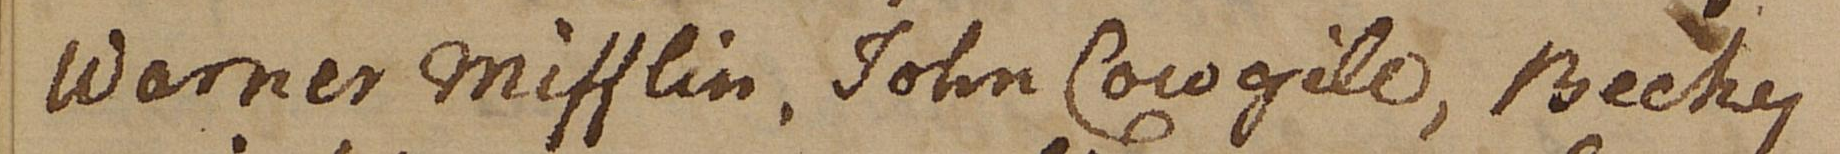Warner Mifflin, John Cowgill, Becky
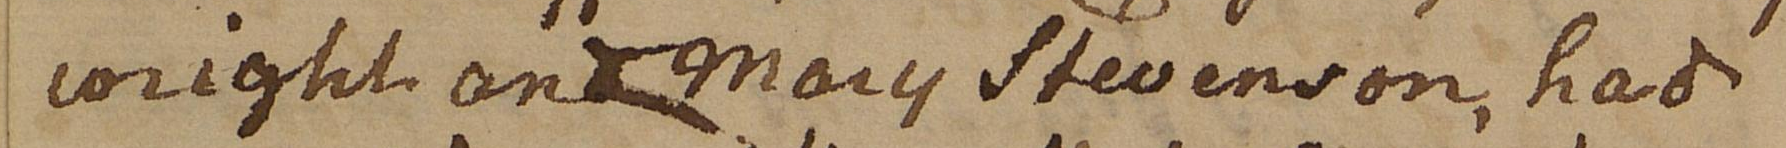wright and Mary Stevenson, had
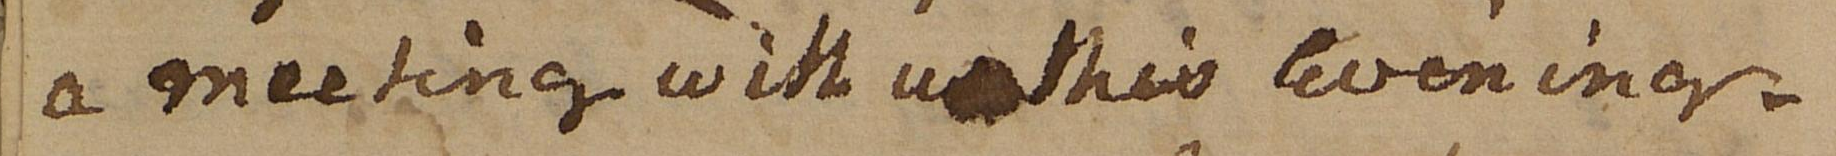a meeting with us this Evening.
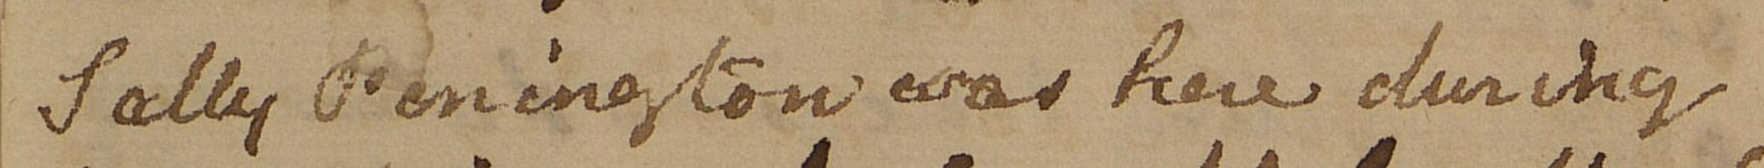Sally Penington was here during
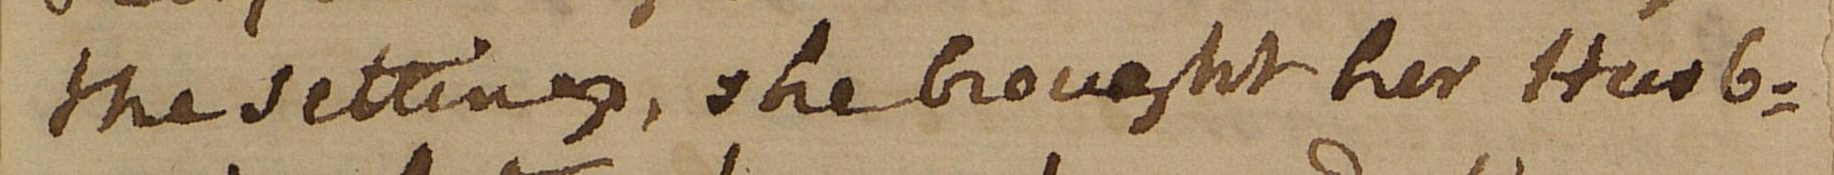the setting, she brought her Husb-
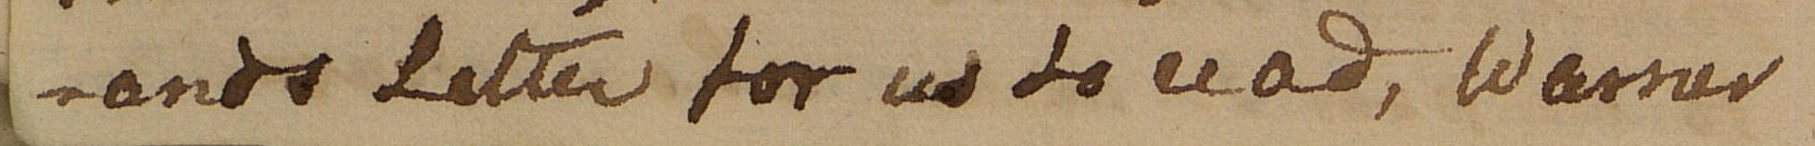-ands Letter for us to read, Warner
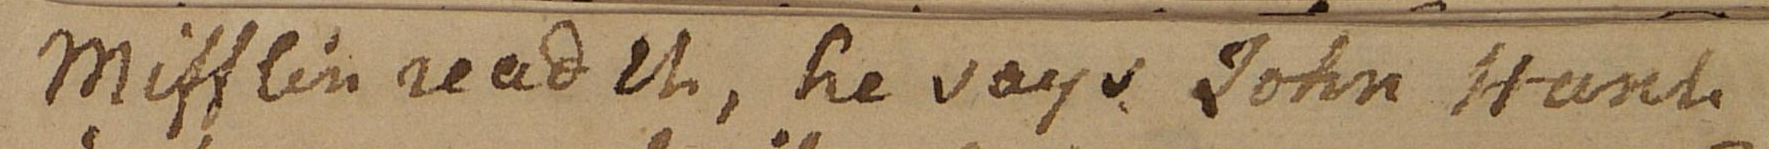Mifflin read it, he says John Hank
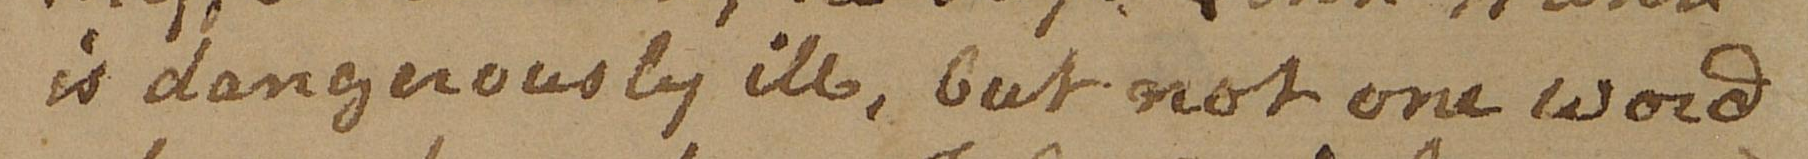is dangerously ill, but not one word
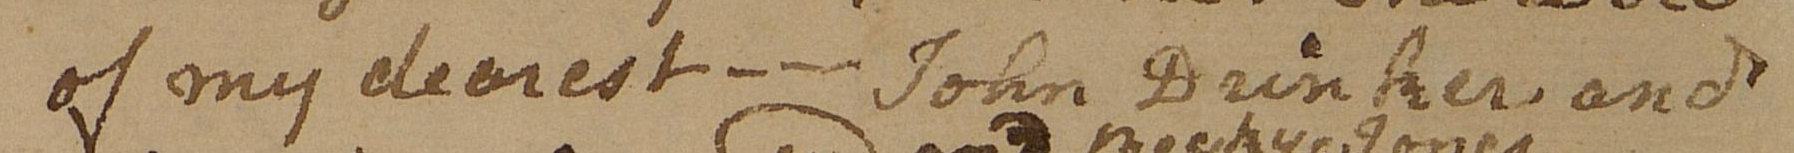of my dearest-- John Drinker and
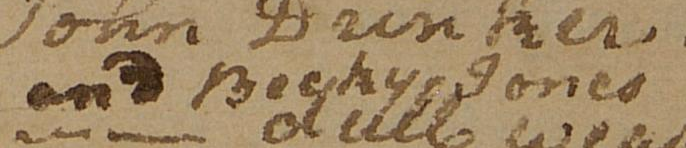and Becky Jones
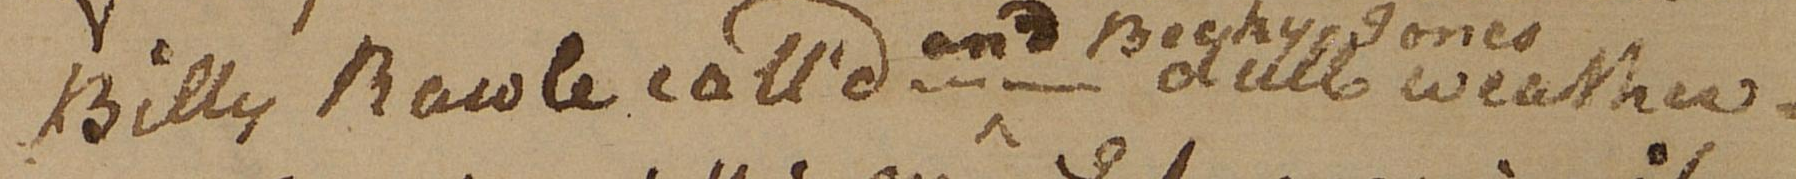Billy Bawle call'd-- ^ dull weather
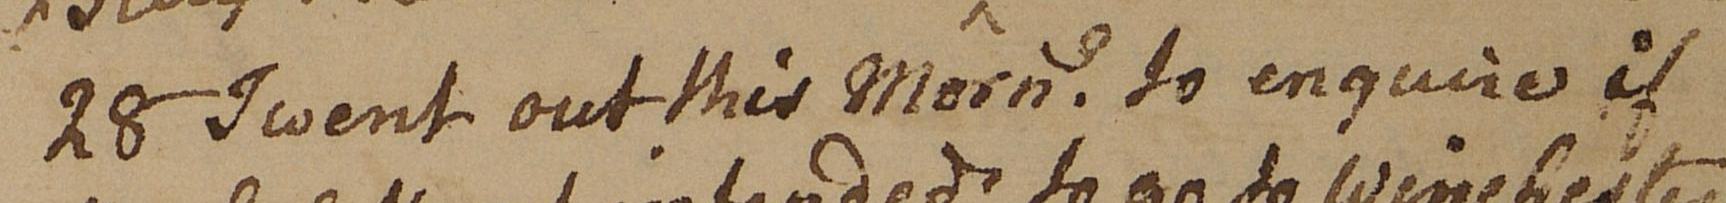28 I went out this Morn^g. to enquire if
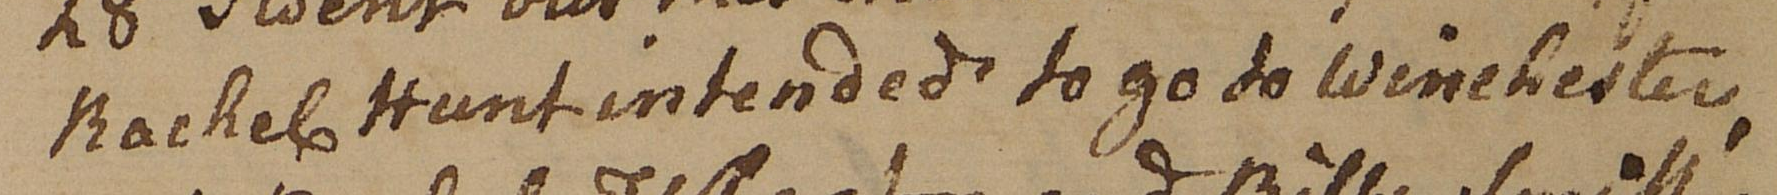Rachel Hunt intended to go to Winchester,
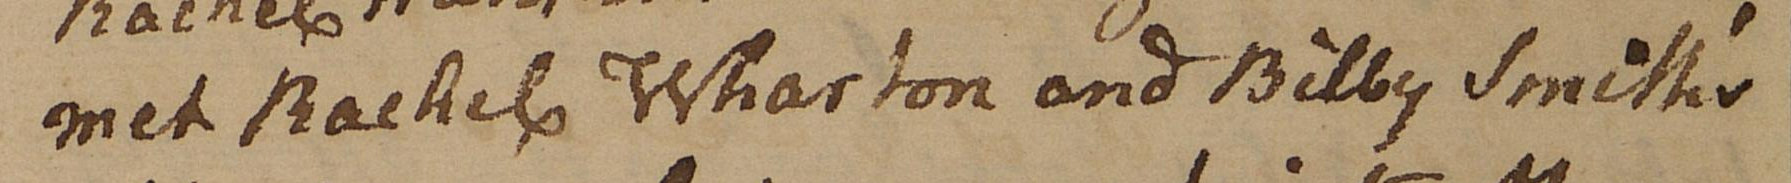met Rachel Wharton and Billy Smiths
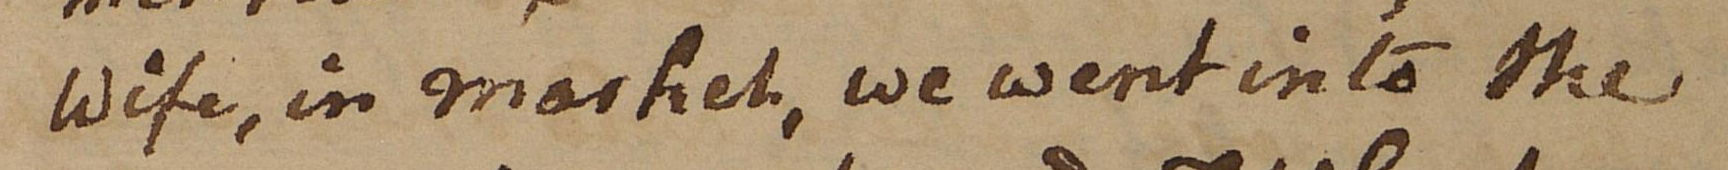Wife, in market, we went into the
